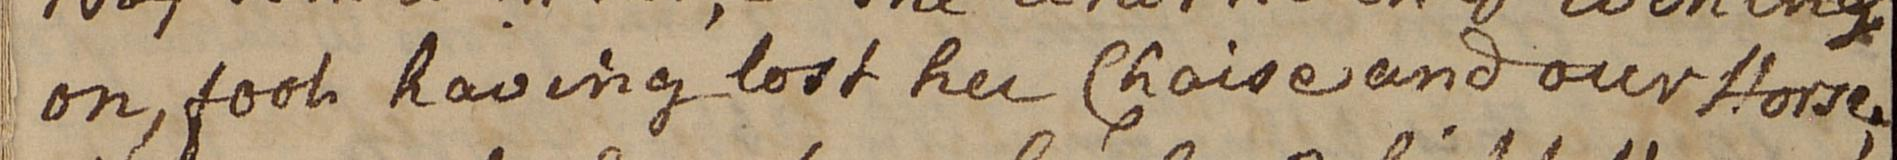on, foot having lost her Chaise and our Horse,
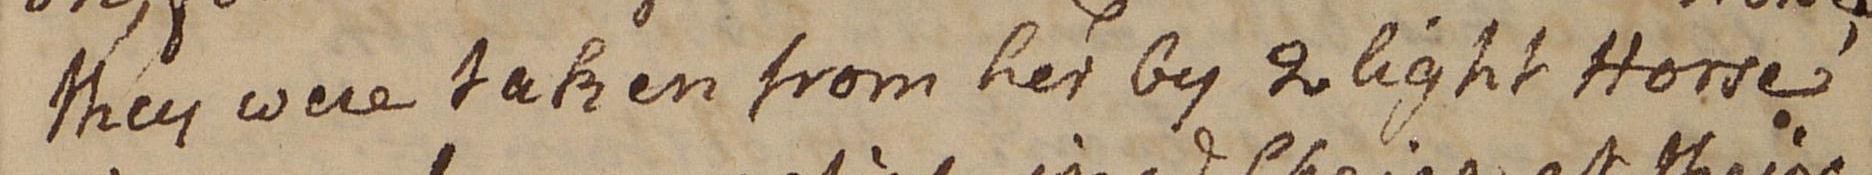they were taken from her by 2 light Horse
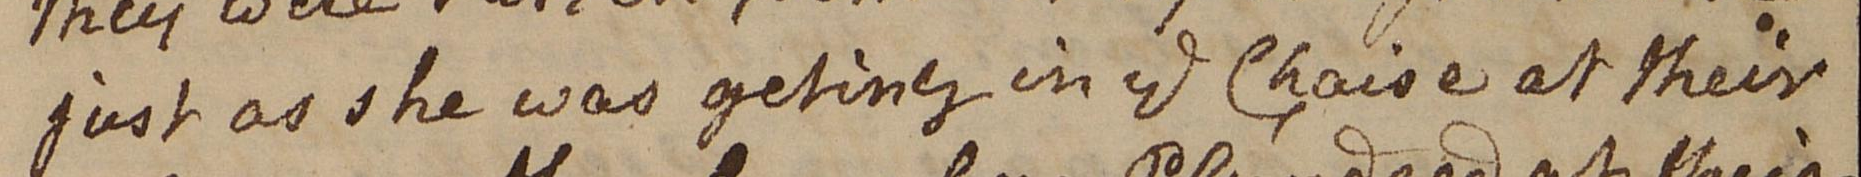just as she was geting in y^e Chaise at their
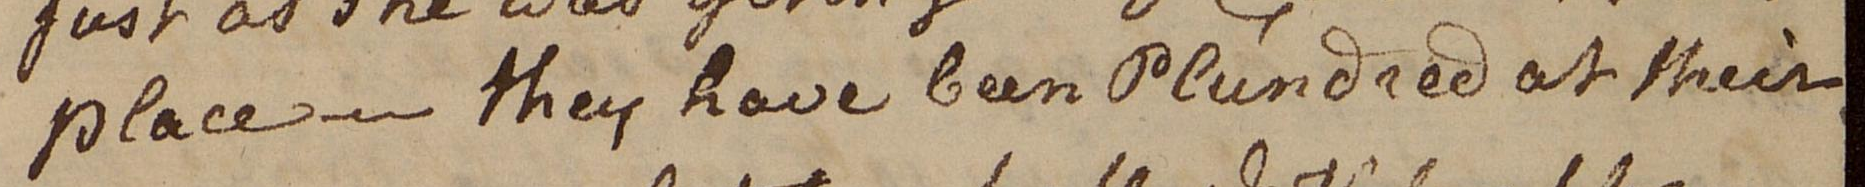place- they have been Plundred at their
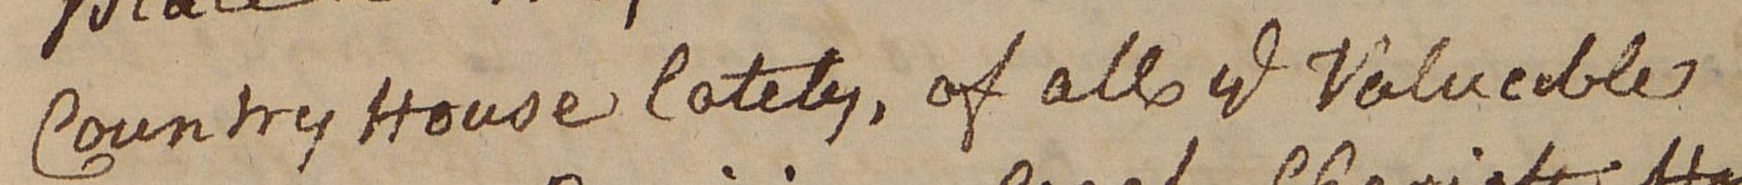Country House lately, of all y^e Valuable
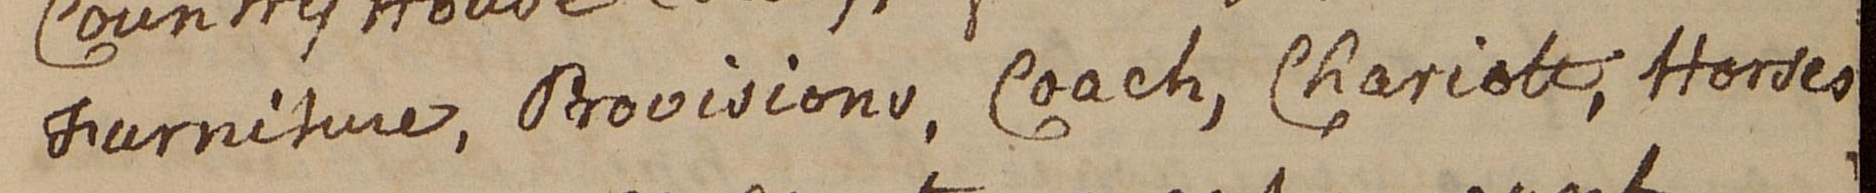Furniture, Provisions, Coach, Chariott, Horses
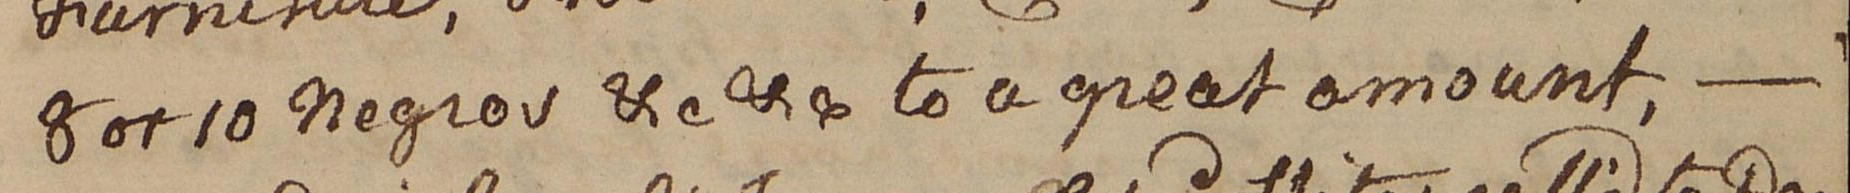8 or 10 Negros &c to a great amount,-
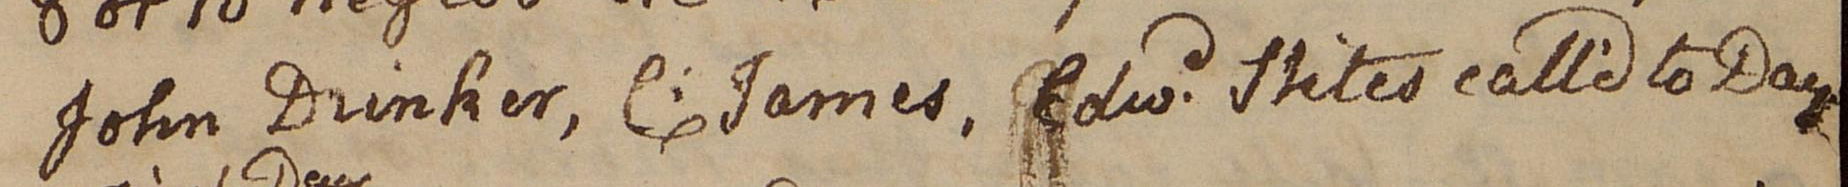John Drinker, C. James, Edw^d. Stites call'd to Day
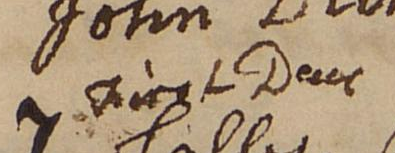First Day
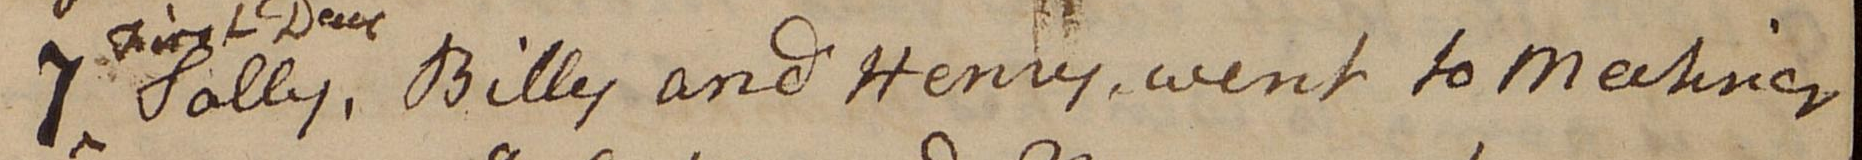7 ^ Sally, Billy and Henry, went to Meeting
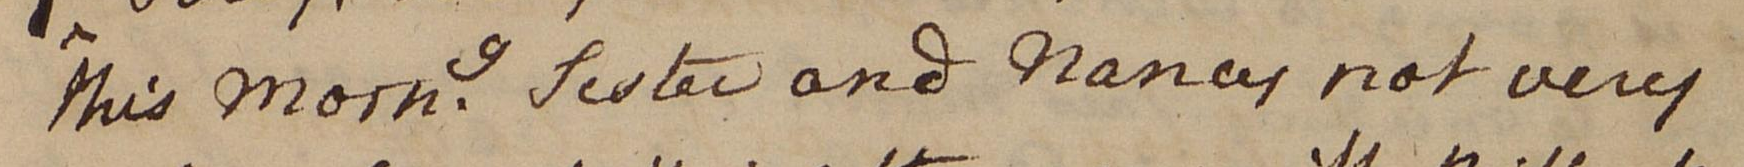this Morn^g. Sister and Nancy not very
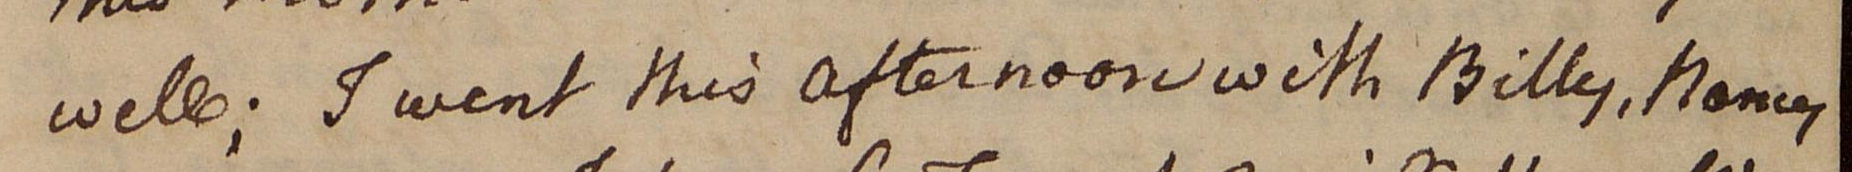well; I went this Afternoon with Billy, Nancy
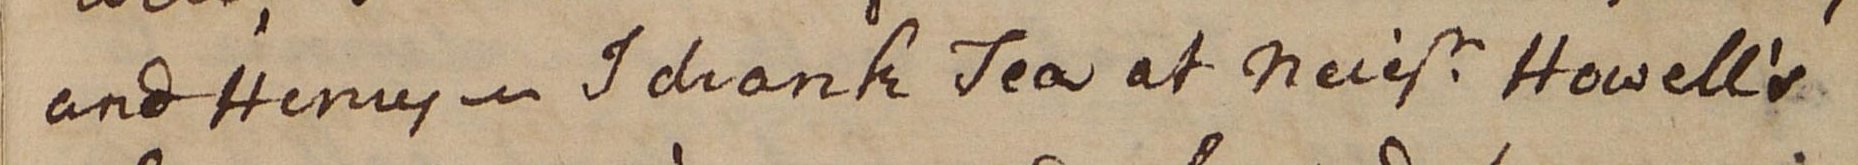and Henry- I drank Tea at Neig^r. Howell's
